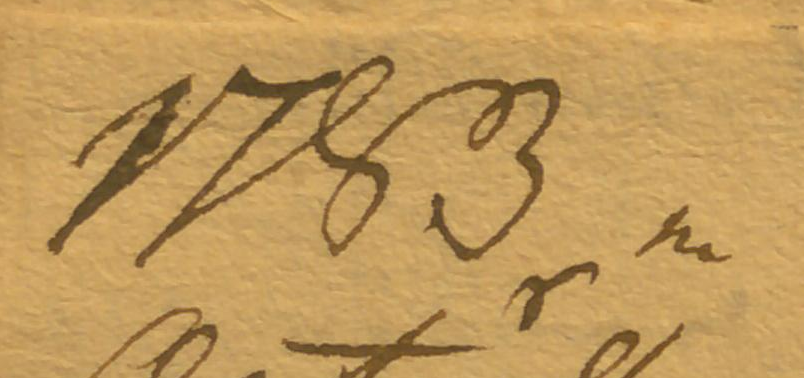1783
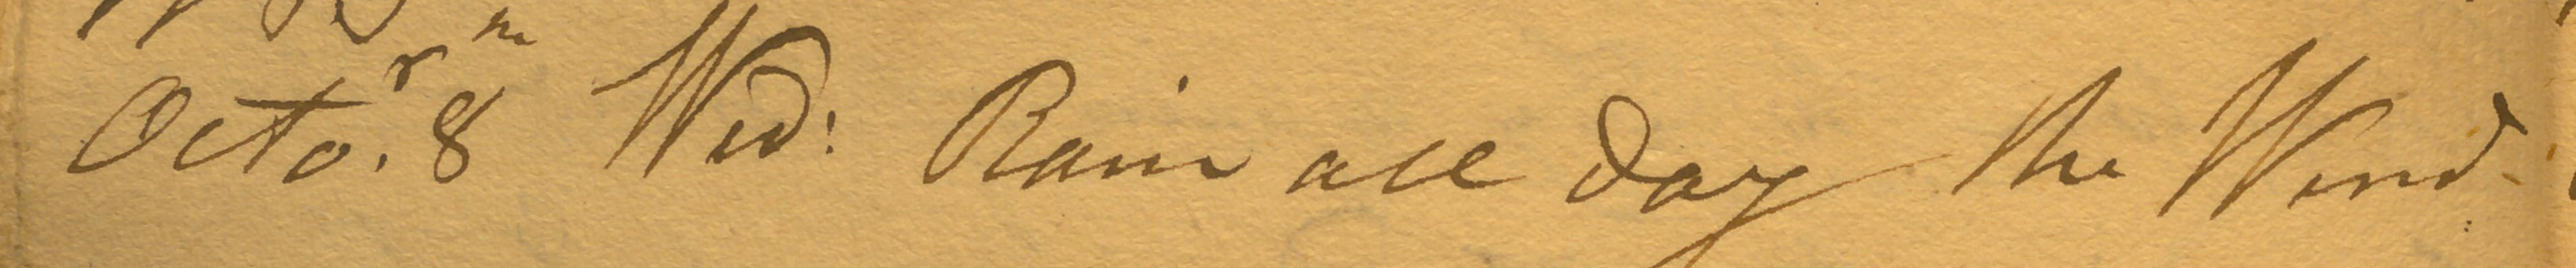Octo^r. 8 Wed: Rain all day the Wind
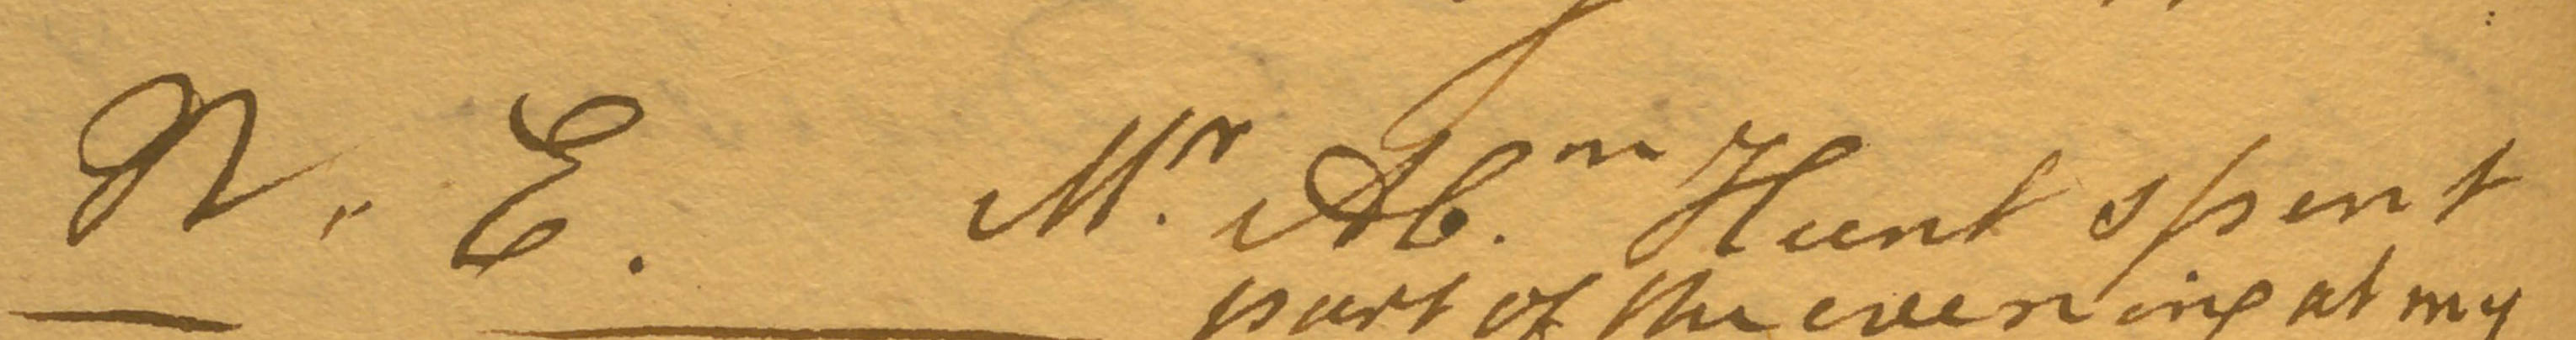N.E. M^r. Ab^m. Hunt spent
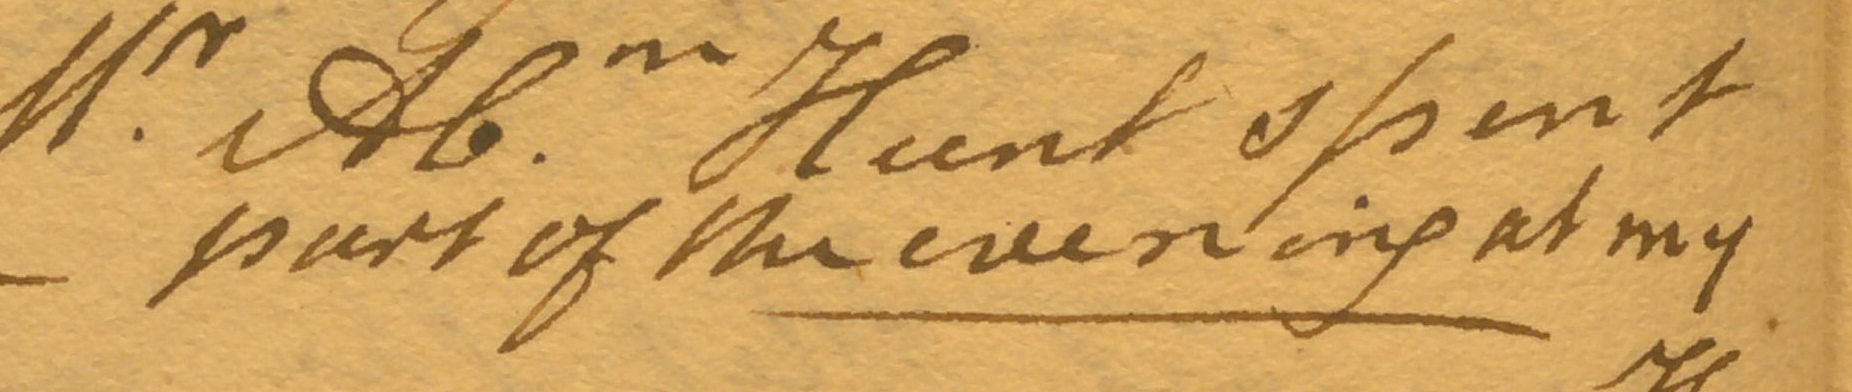part of the evening at my
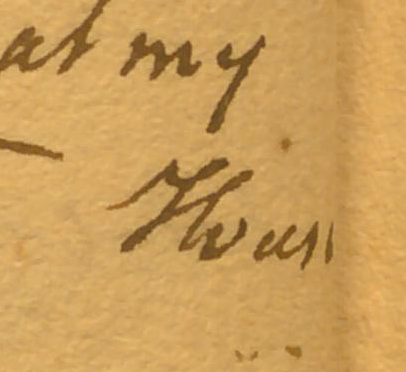House
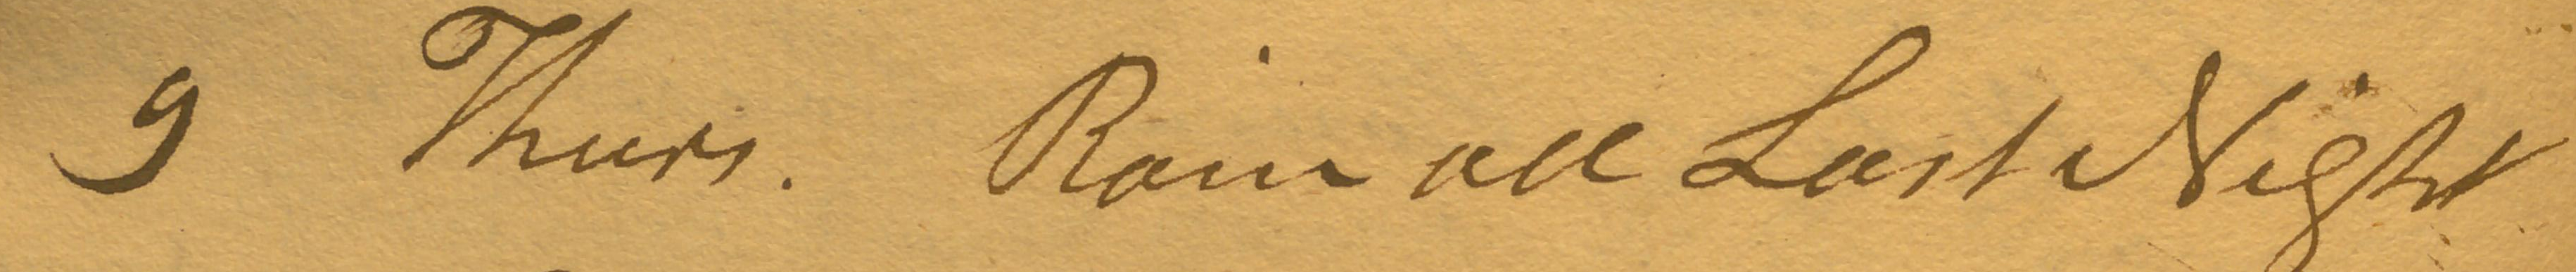9 Thurs. Rain all Last Night
